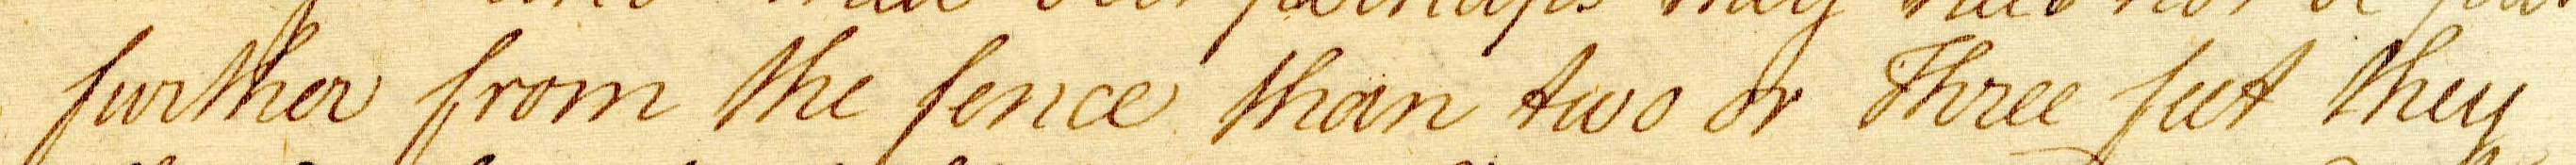further from the fence than two or Three feet they
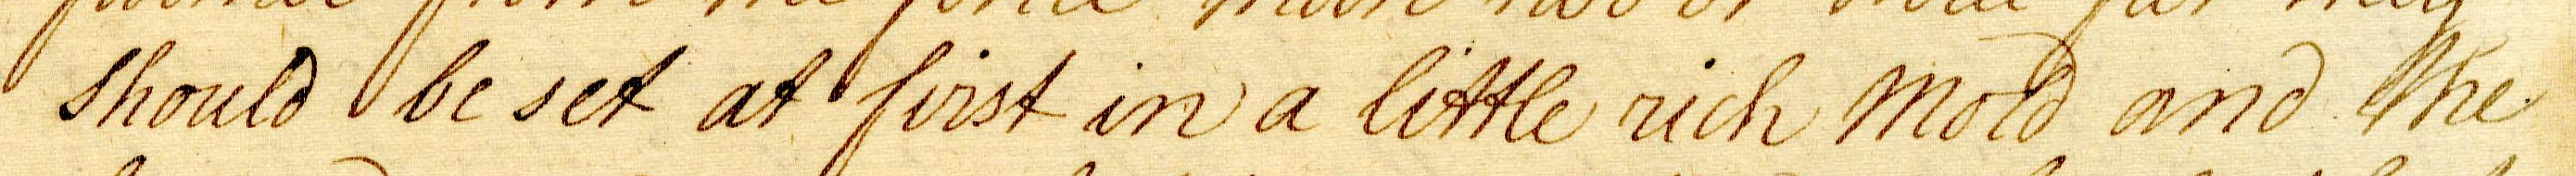Should be set at first in a little rich Mold and the
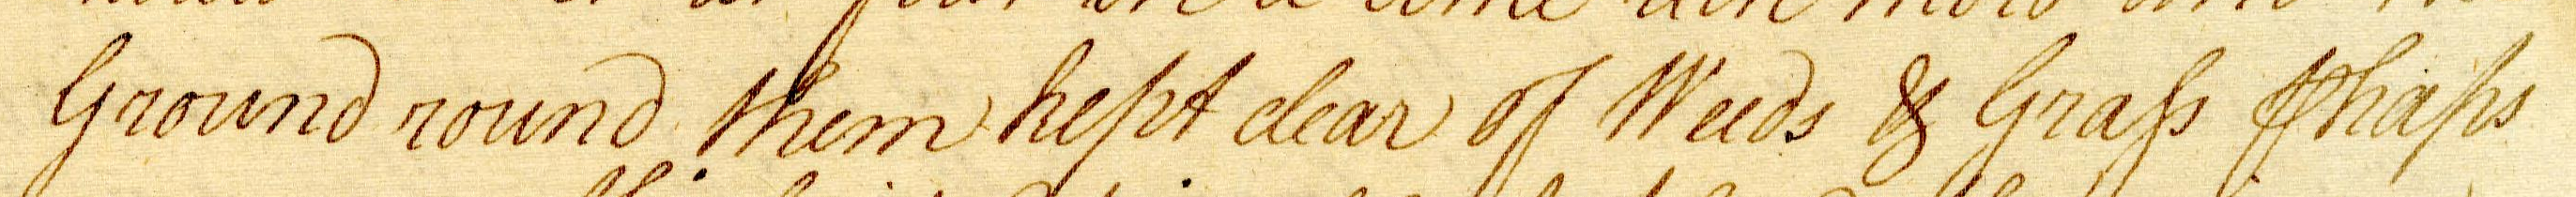Ground round them kept clear of Weeds & Grass perhaps
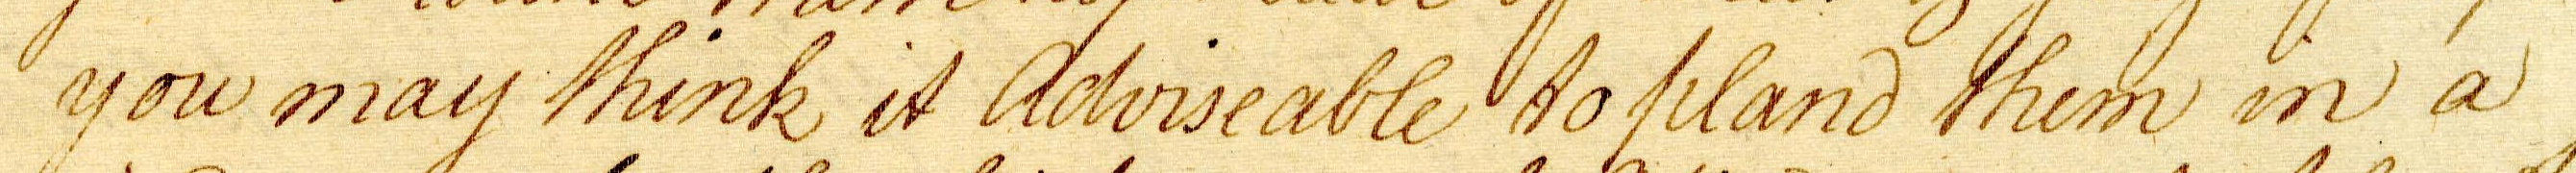you may think it Adviseable to pland them in a
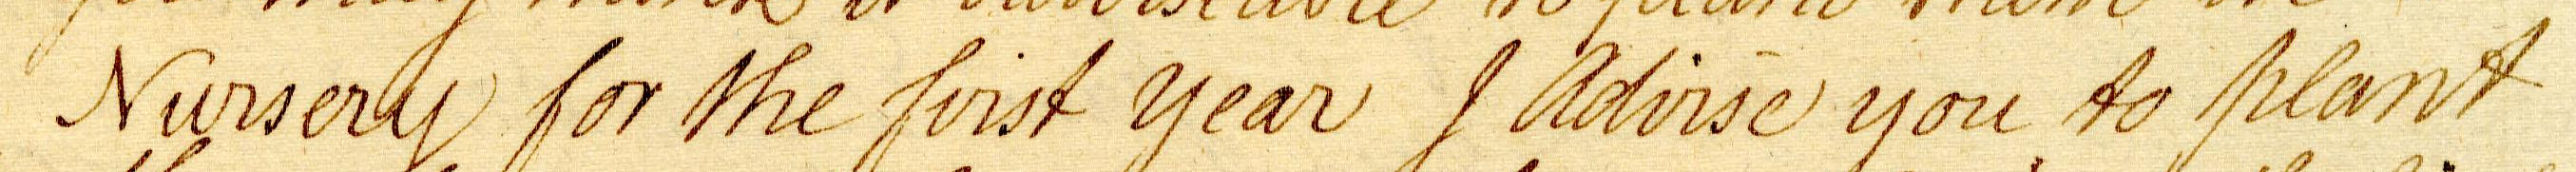Nursery for the first Year I Advise you to plant
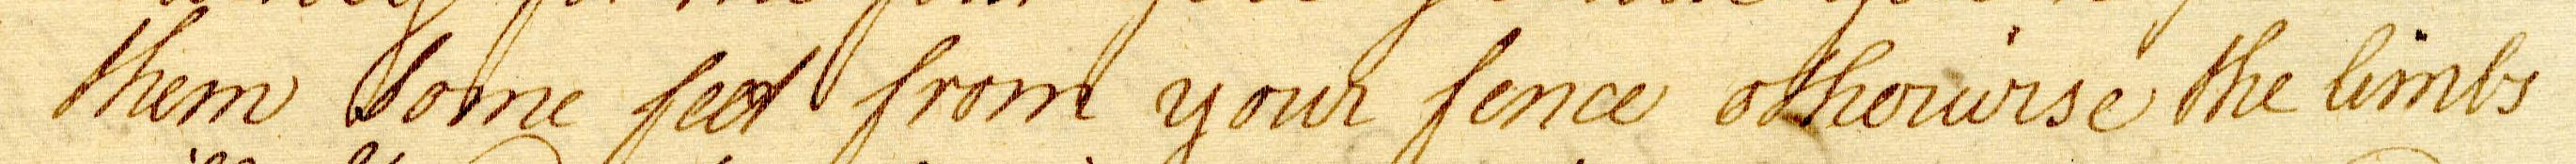them some feet from your fence otherwise the limbs
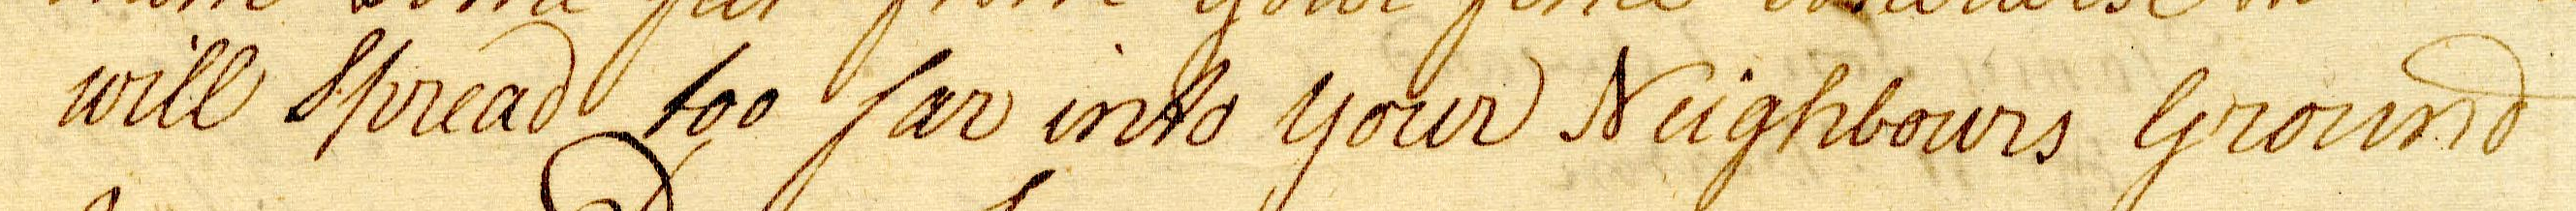will Spread too far into your Neighbours Ground
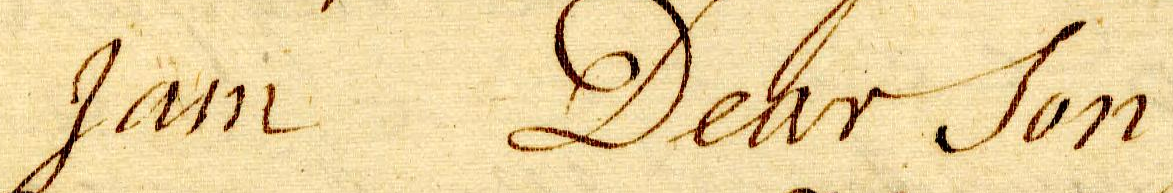I am Dear Son
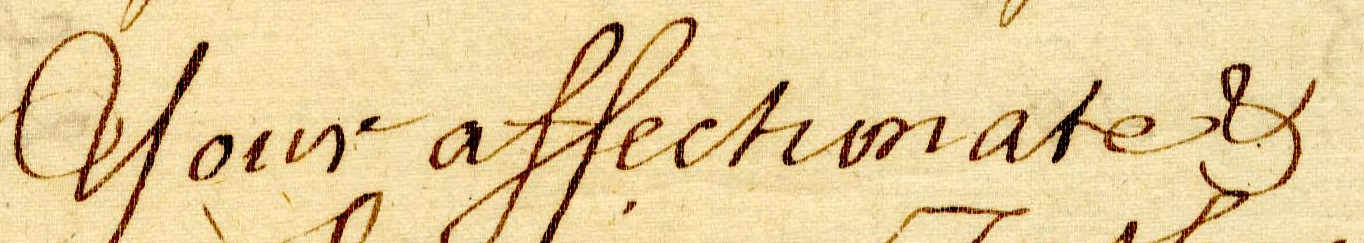Your affectionate &
